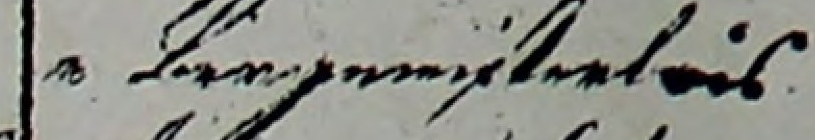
v. Bergmeisterl?is
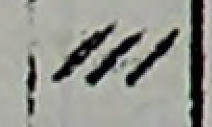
111
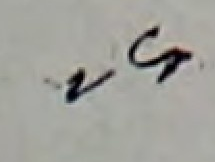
do
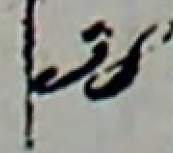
38
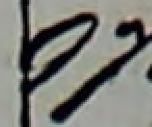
97
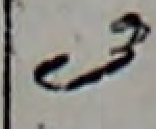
3
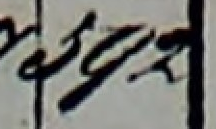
592
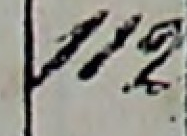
112
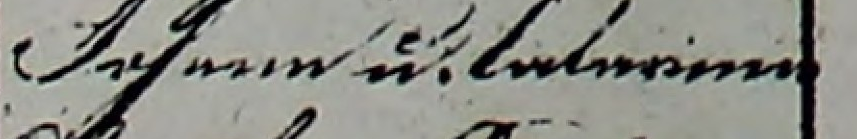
Johann u. Calarina
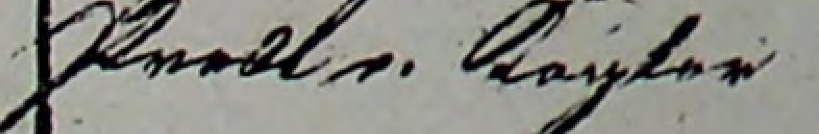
Presl v. Kogler
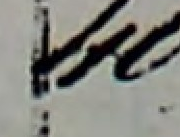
40
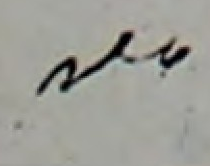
do
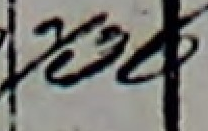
736
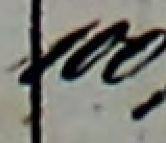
100
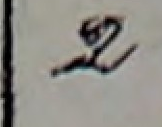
2
